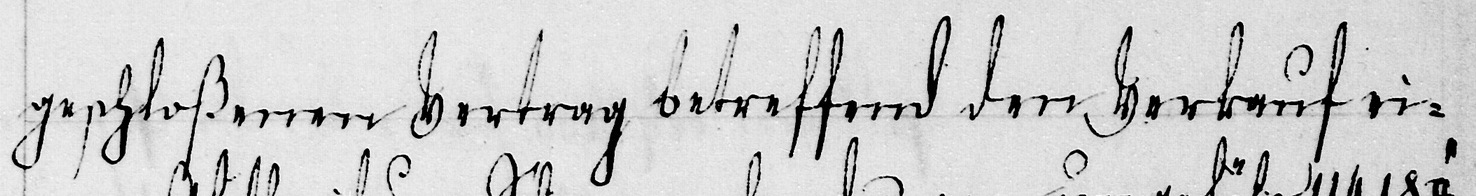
geschloßenen Vertrag betreffend den Verkauf ei¬
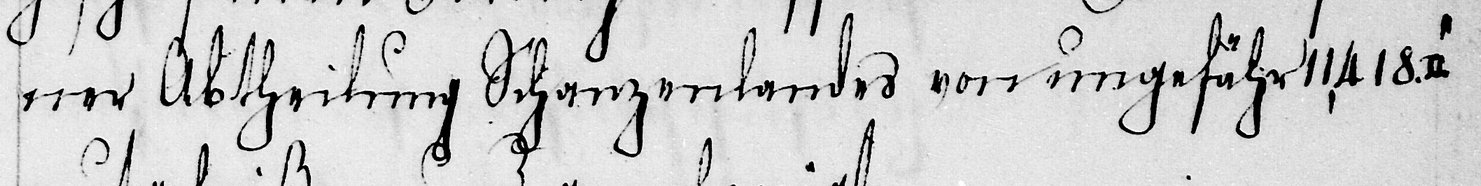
ner Abtheilung Schanzenlandes von ungefähr 11,418
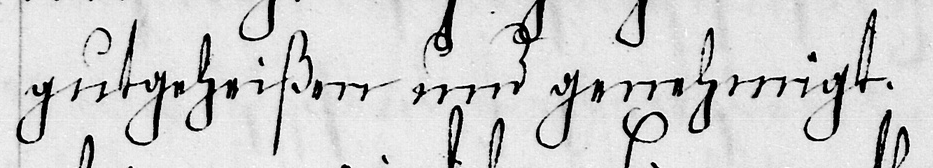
gutgeheißen und genehmigt.
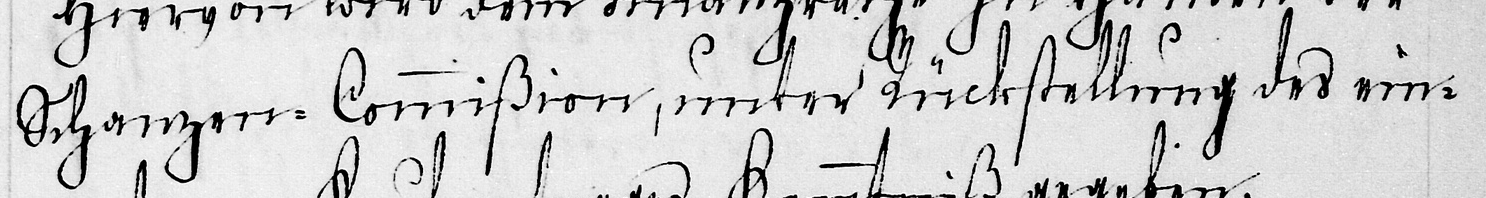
Schanzen-Commißion, unter Rückstellung des ein¬
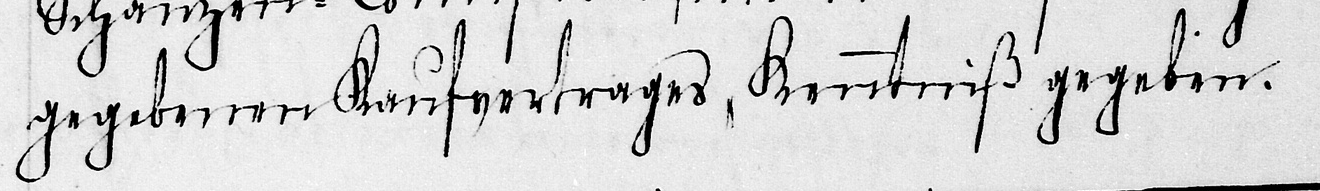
gegebenen Kaufvertrages, Kenntniß gegeben.
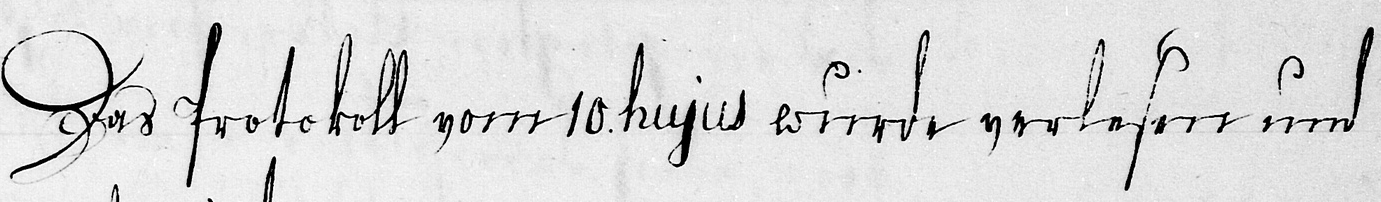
Das Protokoll vom 10. hujus wurde verlesen und
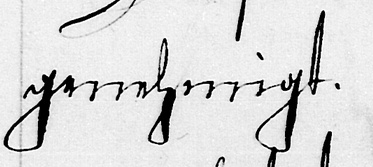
genehmigt.
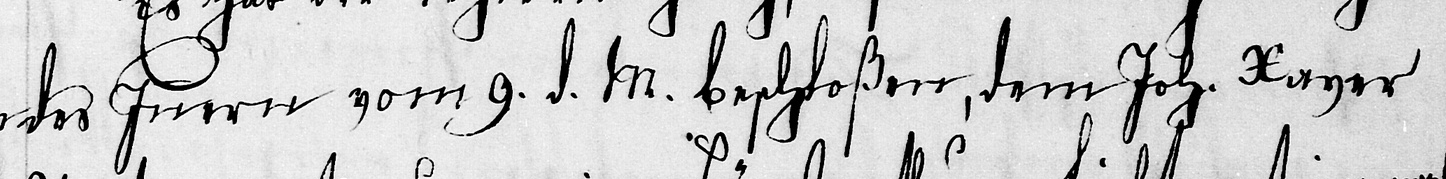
des Innern vom 9. d. M. beschloßen, dem Joh. Xaver
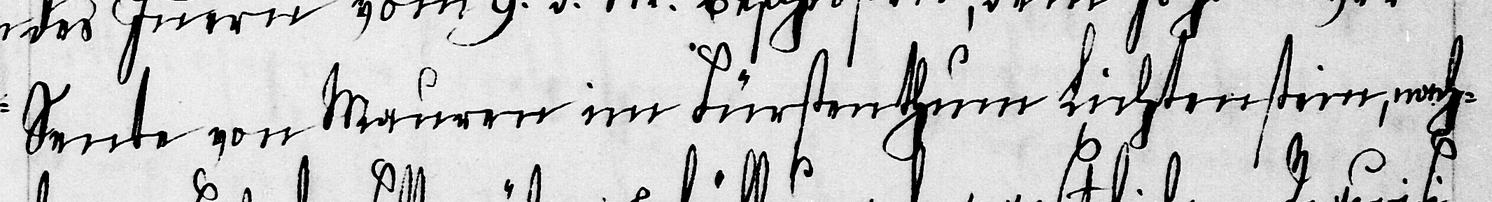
Sente von Mauren im Fürstenthum Lichtenstein, nach¬
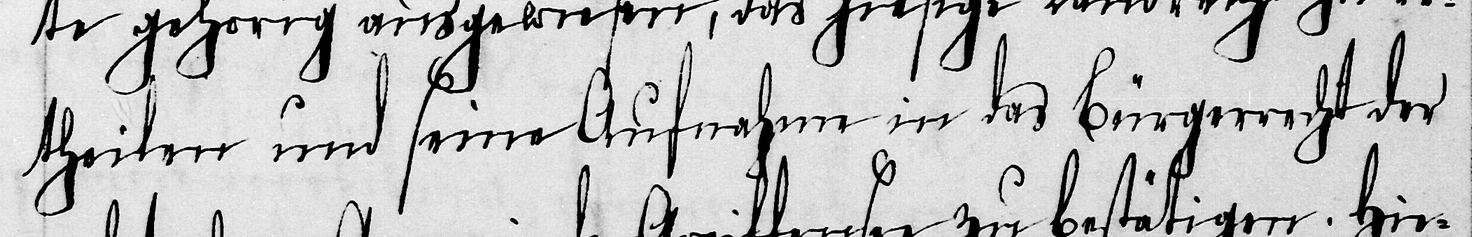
theilen und seine Aufnahme in das Bürgerrecht der
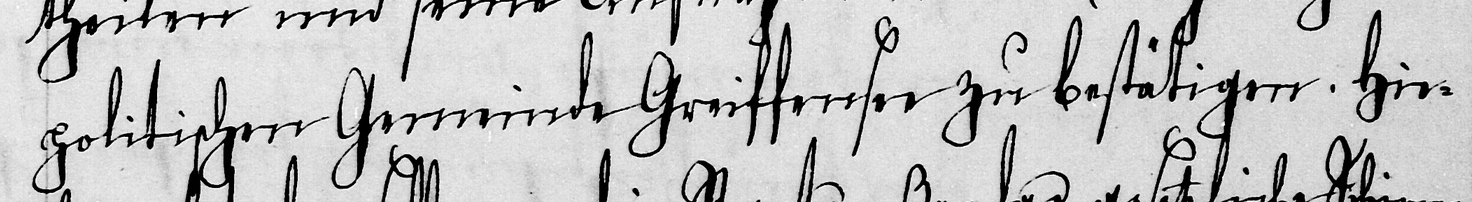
politischen Gemeinde Greifensee zu bestätigen. Hie¬
